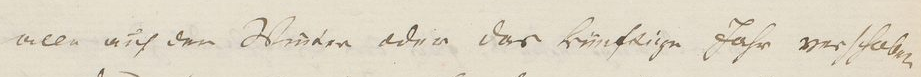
alle auf den Winter oder das künftige Jahr verschoben
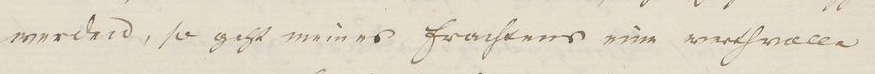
werden, so geht meines Erachtens eine werthvolle
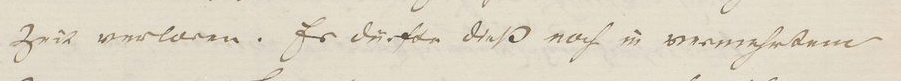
Zeit verloren. Es dürfte dieß noch in vermehrtem
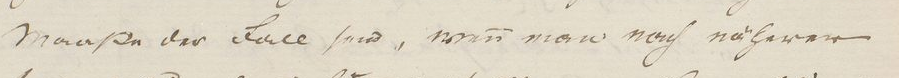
Maaße der Fall sein, wenn man nach näherer
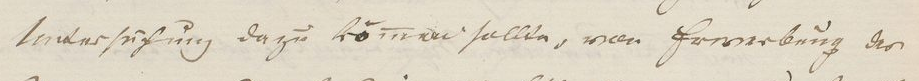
Untersuchung dazu kommen sollte, von Erwerbung des
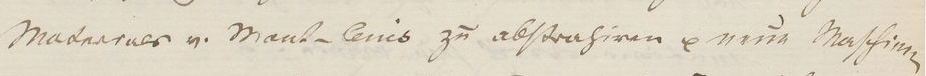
Materials v. Mont-Cenis zu abstrahiren & neue Maschinen
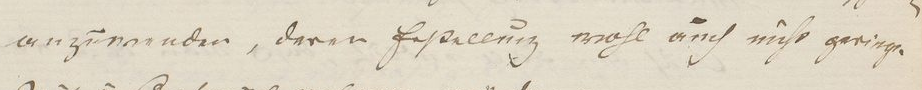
anzuwenden, deren Erstellung wohl auch nicht geringe
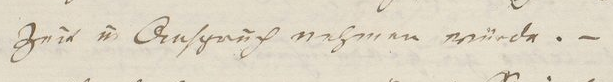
Zeit in Anspruch nehmen würde. –
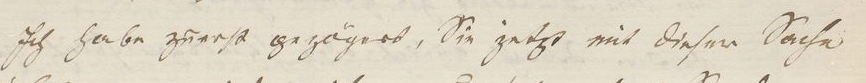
Ich habe zuerst gezögert, Sie jetzt mit dieser Sache
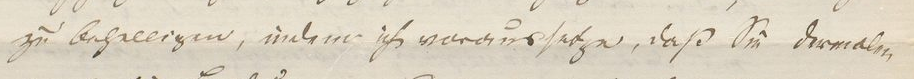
zu behelligen, indem ich voraussetze, daß Sie dermalen
